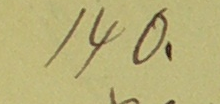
140
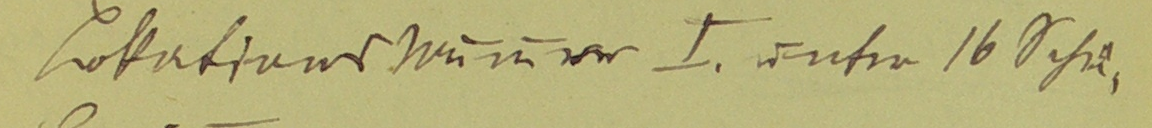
Lokationsnummer I unter 16 Schü¬
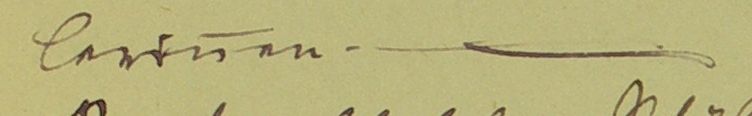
lerinnen.--
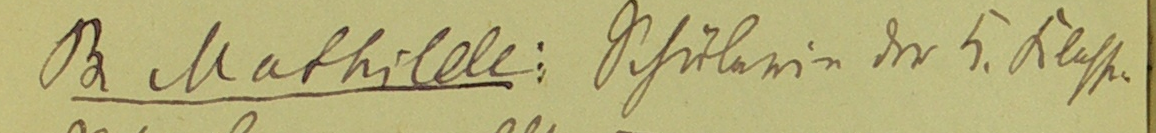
B. Mathilde: Schülerin der 5. Klasse.
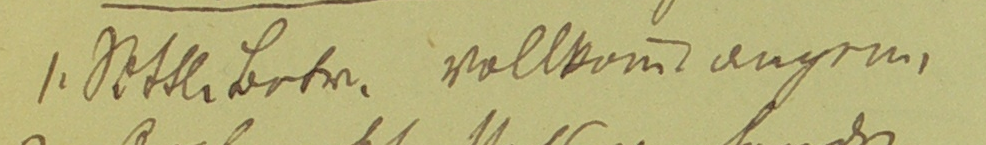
1. Sittliches Betr.: vollkommen angemessen
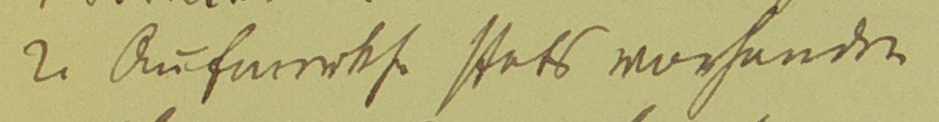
2. Aufmerks.: stets vorhanden
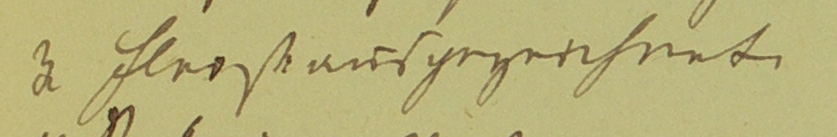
3. Fleiß: ausgezeichnet
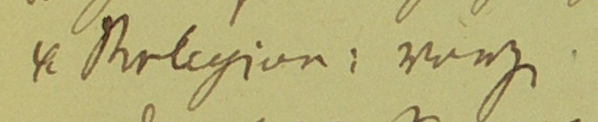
4. Religion: vorz.
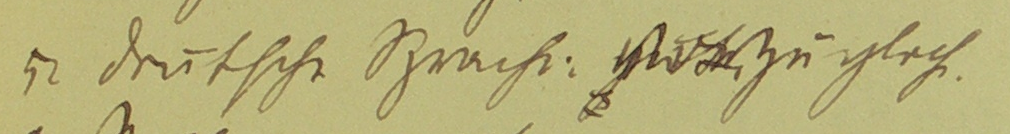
5. Deutsche Sprache : vorzüglich
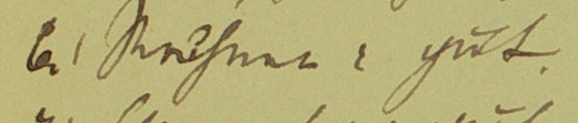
6. Rechnen: gut
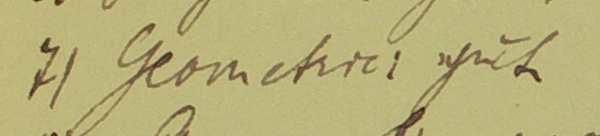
7. Geometrie : gut
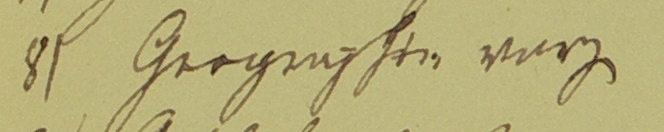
8. Geographie: vorzüglich
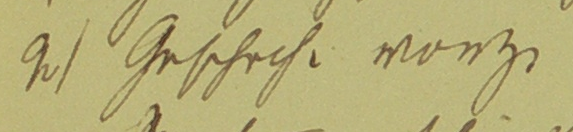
9. Geschichte: Vorzüglich
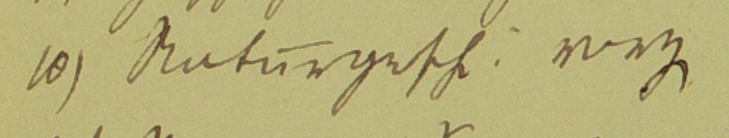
10. Naturgeschichte vorzüglich
